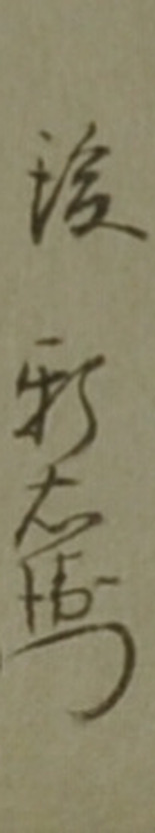後新右衛門
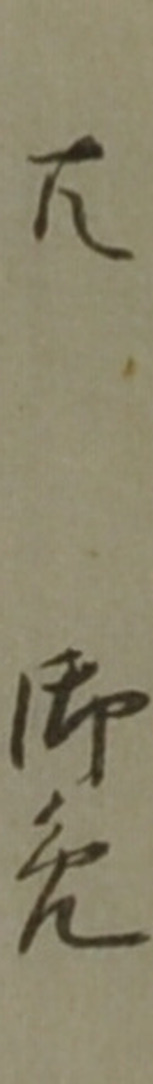共御免
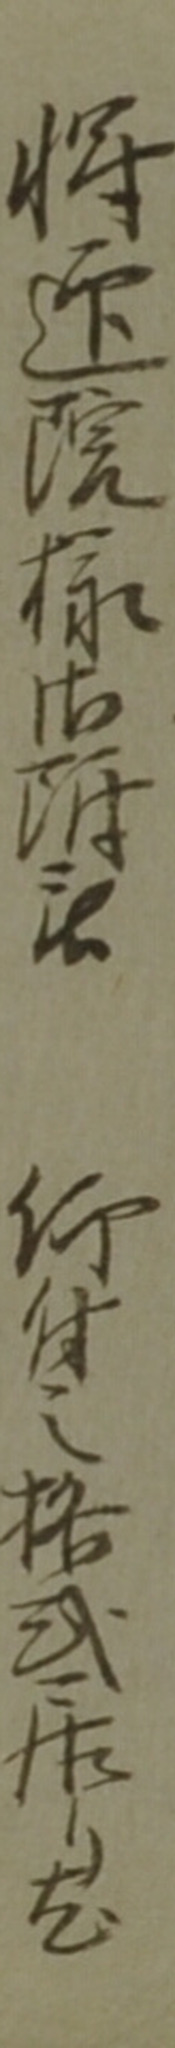将迎院様御附被仰付之格式居り尤
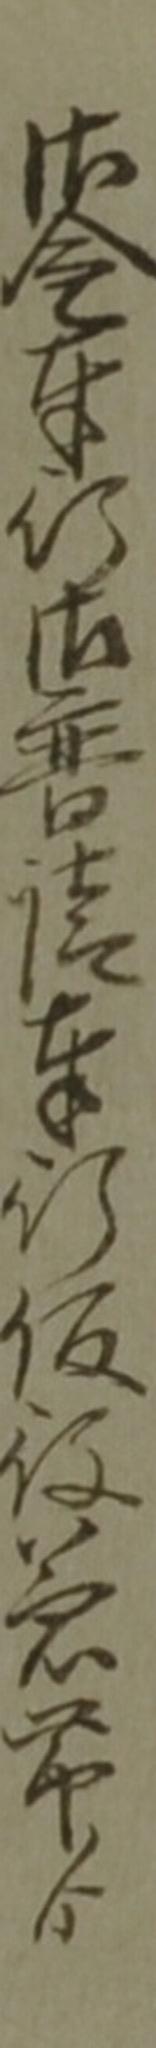御金奉行御普請奉行仮役兼帯ゟ
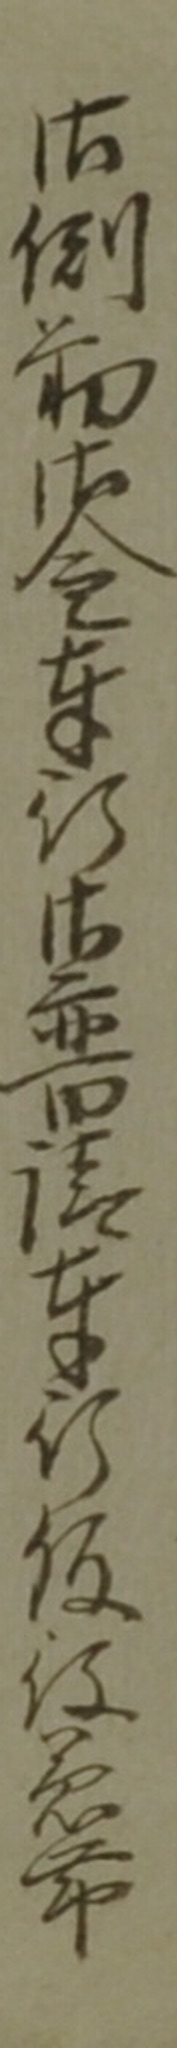御側勤御金奉行御普請奉行仮役兼帯
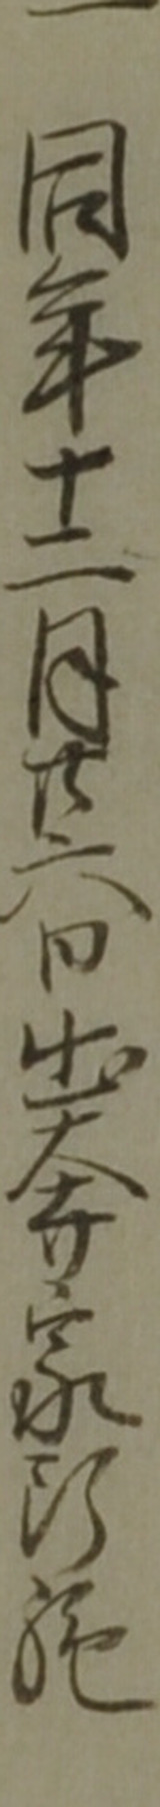一同年十二月廿六日出奔家断絶
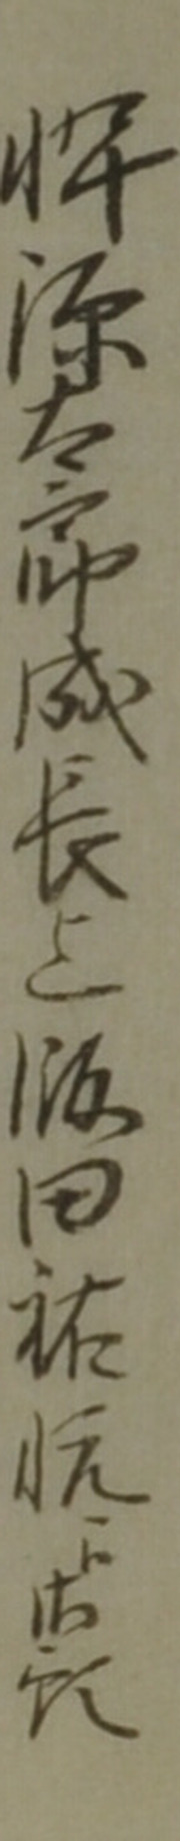忰源太郎成長迄飯田祐悦江御預
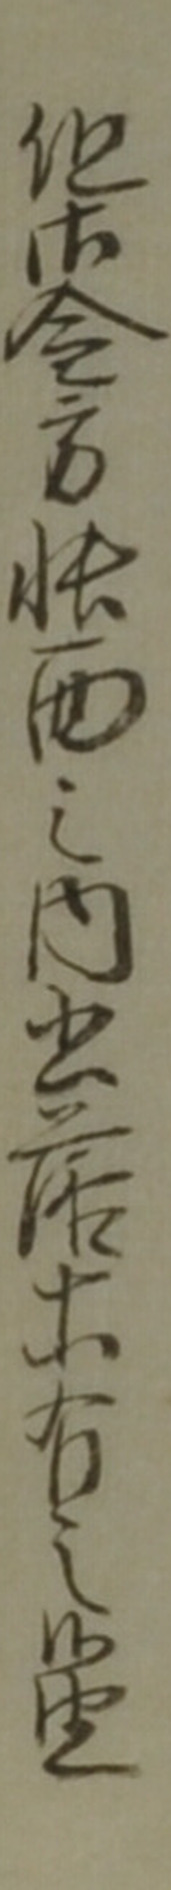但御金方帳面之内書落等有之候定
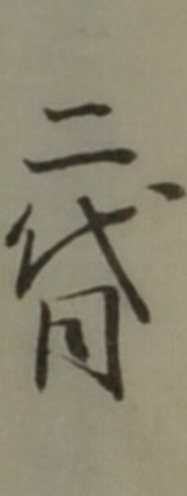二代目
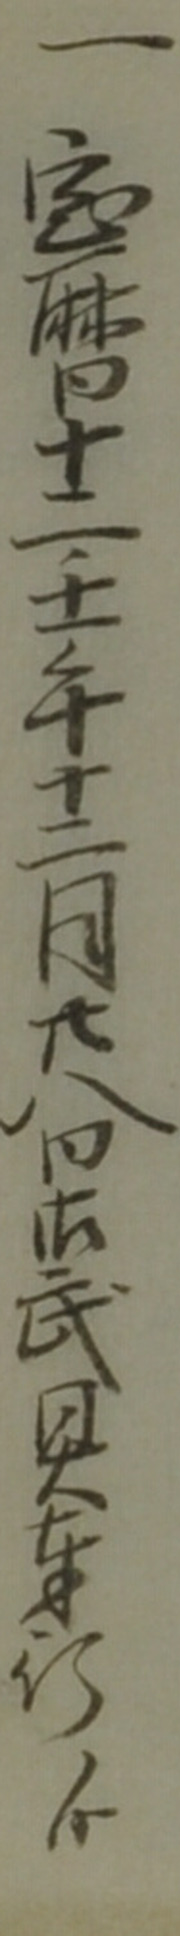一宝暦十二壬午十二月廿八日御武具奉行ゟ
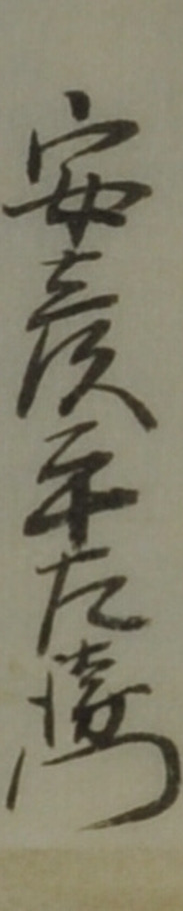安彦平左衛門
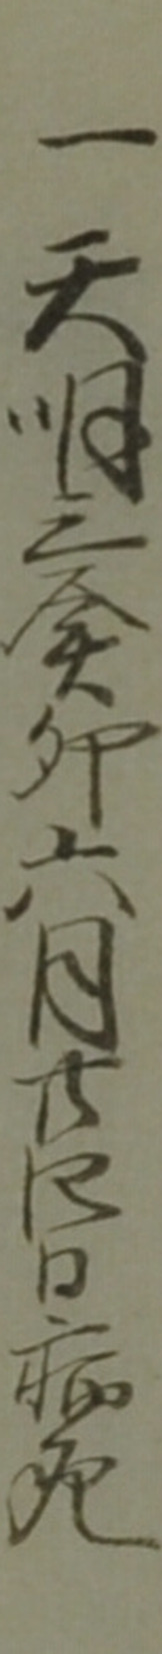一天明三癸卯六月廿四日病死
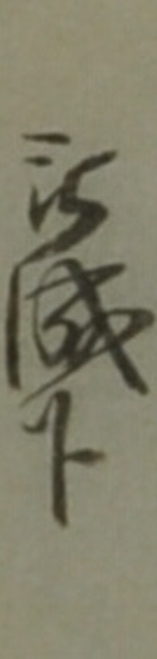被成下
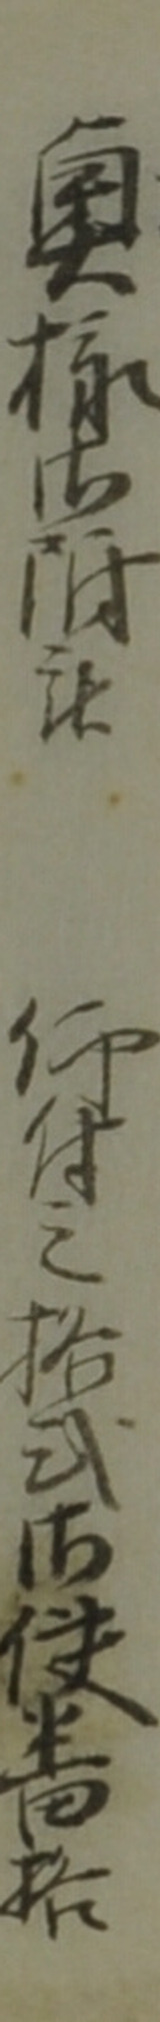奥様御附被仰付之格式御使番格
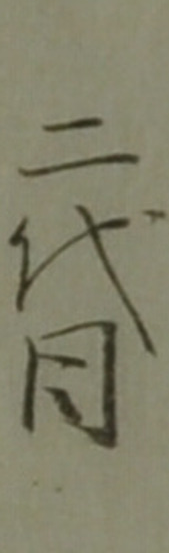二代目
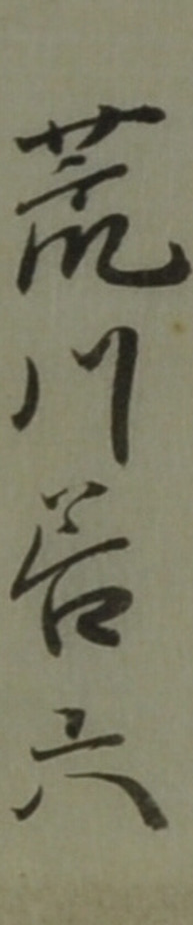荒川善六
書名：諸御役代々録（六）
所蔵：伊那市立高遠町図書館・合同会社AMANE
